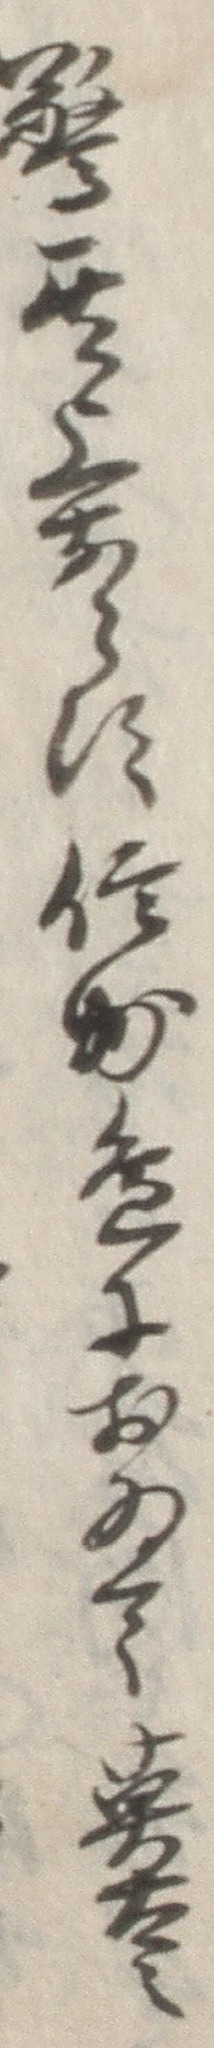驚其上あらす信州辺におゐて莫大之
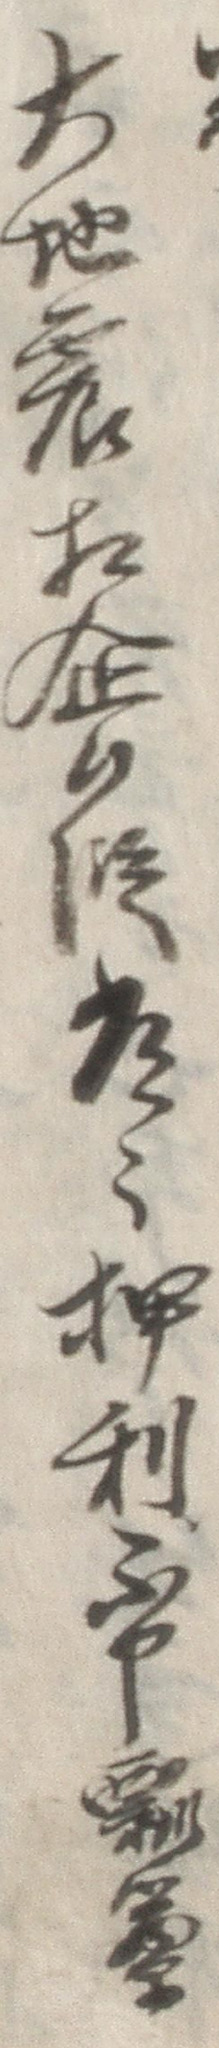大地震相企候段常々押利不申瓢箪
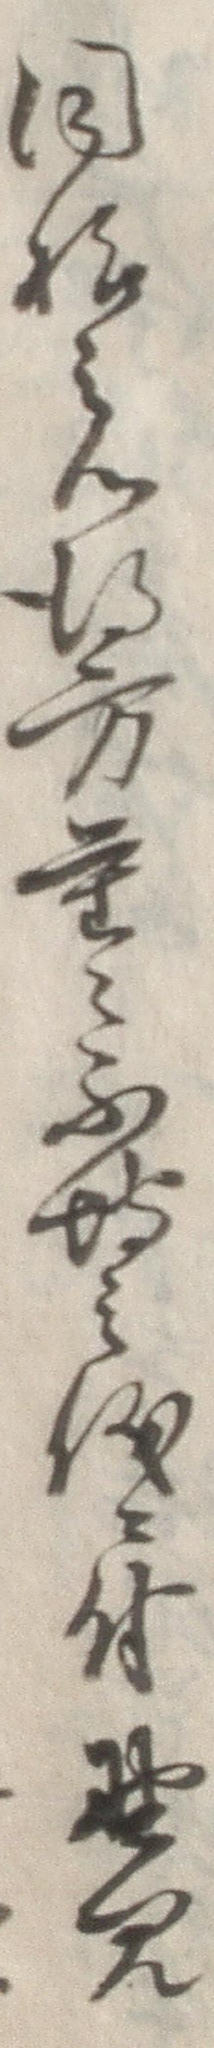同様之心得方重々不埒之儀二付野見
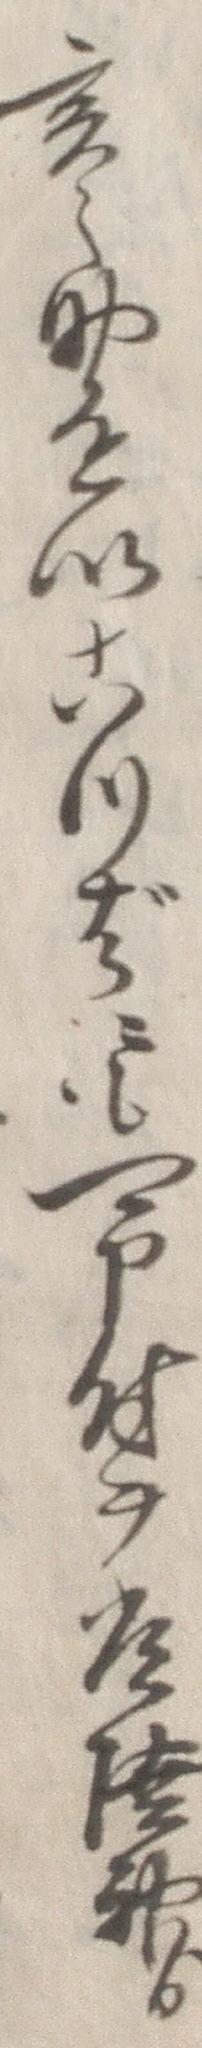亥之助を以こつば二も可申付ヲ常陸神ゟ
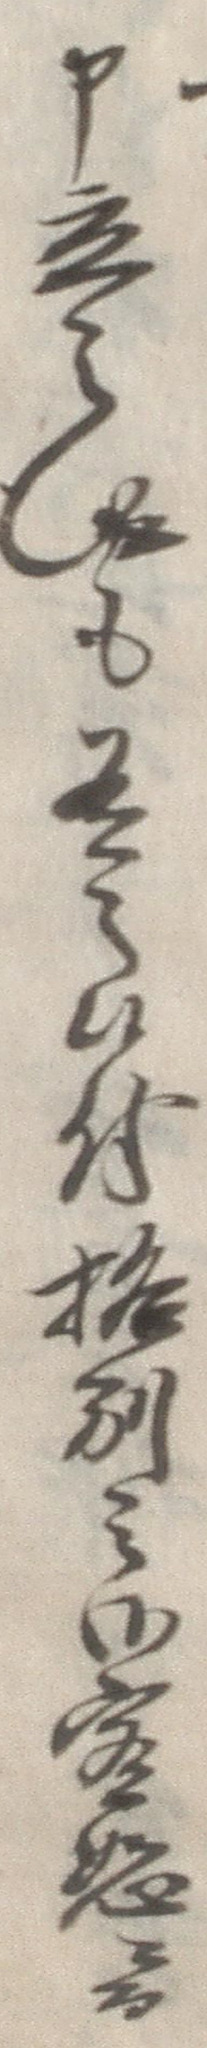申立之趣も有之候付格別之御容恕二而
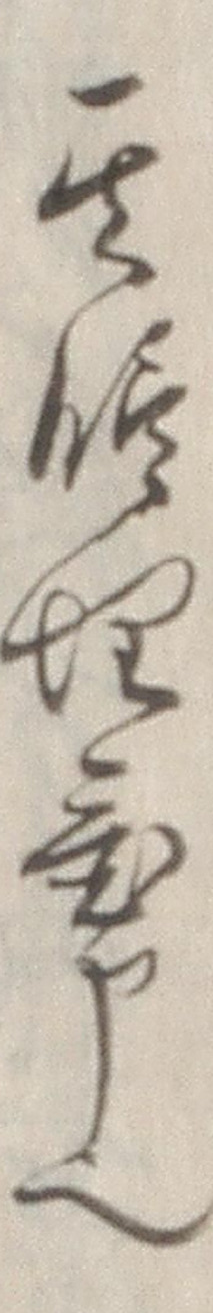其段埋置申也
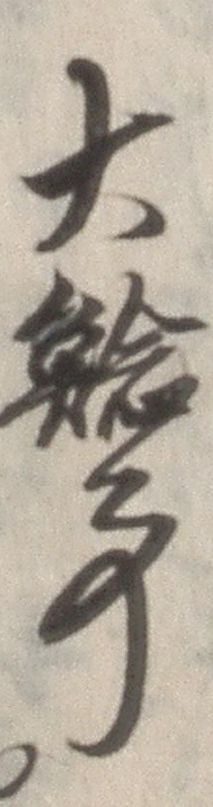大鯰亭
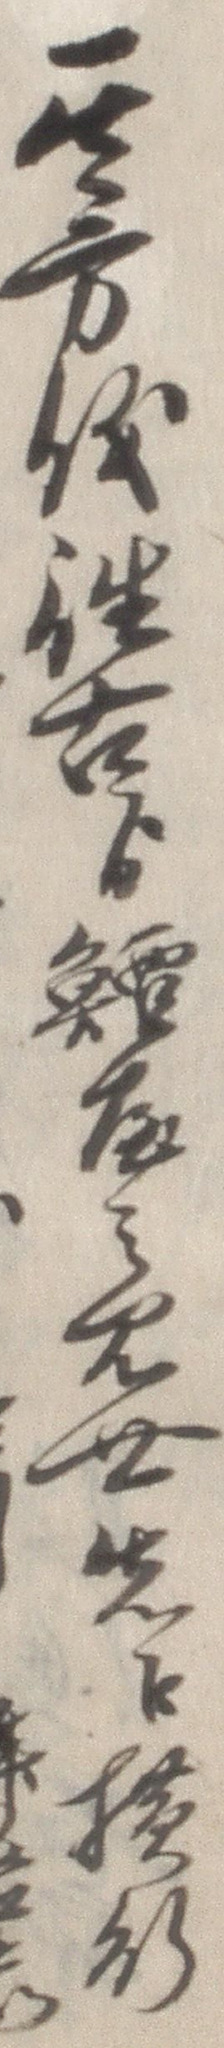其方儀往古ゟ鰻屋之見世先江横行
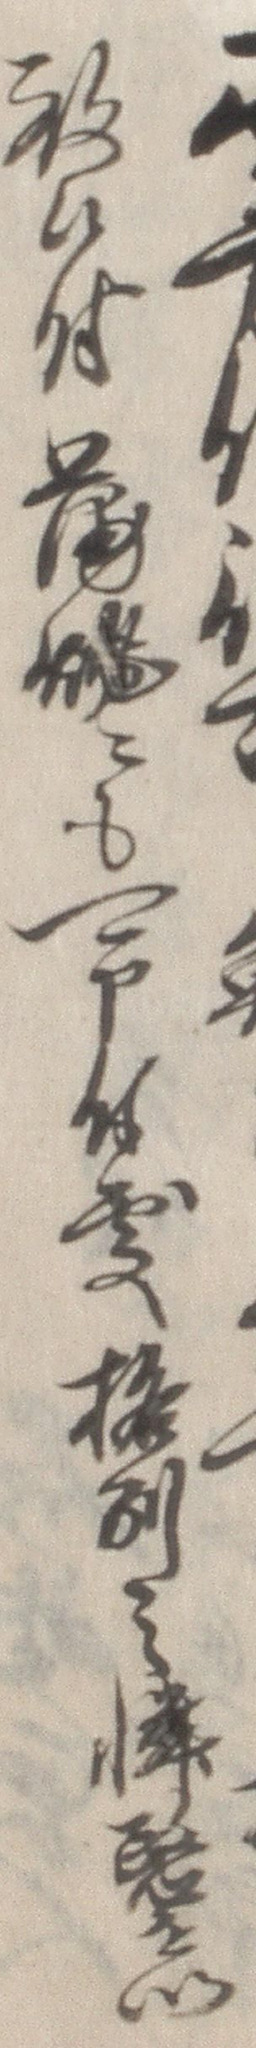致候付蒲焼二も可申付処格別之憐憫を以
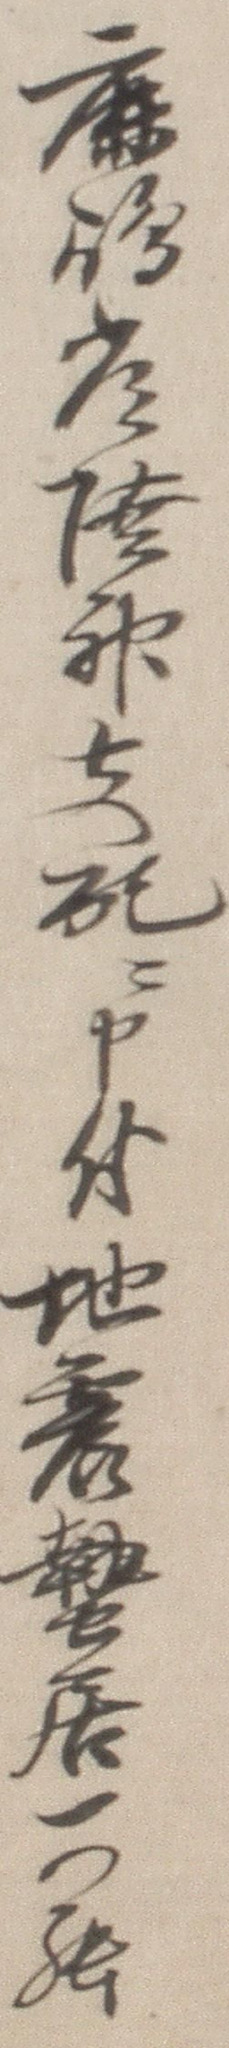廉嶋常陸神支配二申付地震蟄居可罷
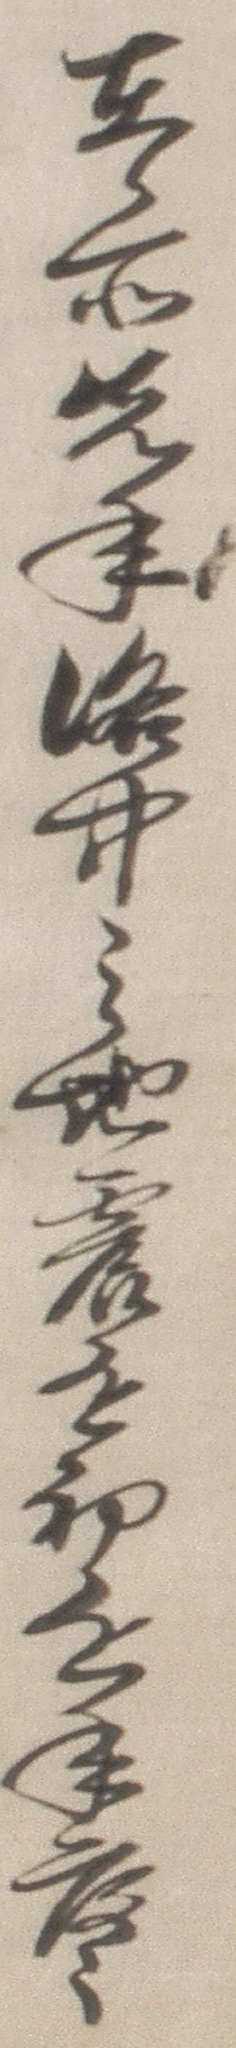在候所先年洛中之地震を初近年度々
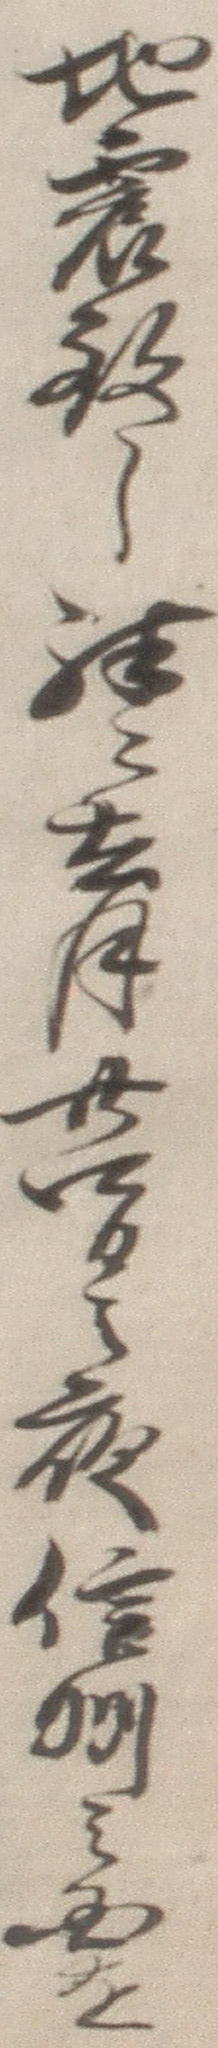地震致し殊二去付廿四日之夜信州之国を
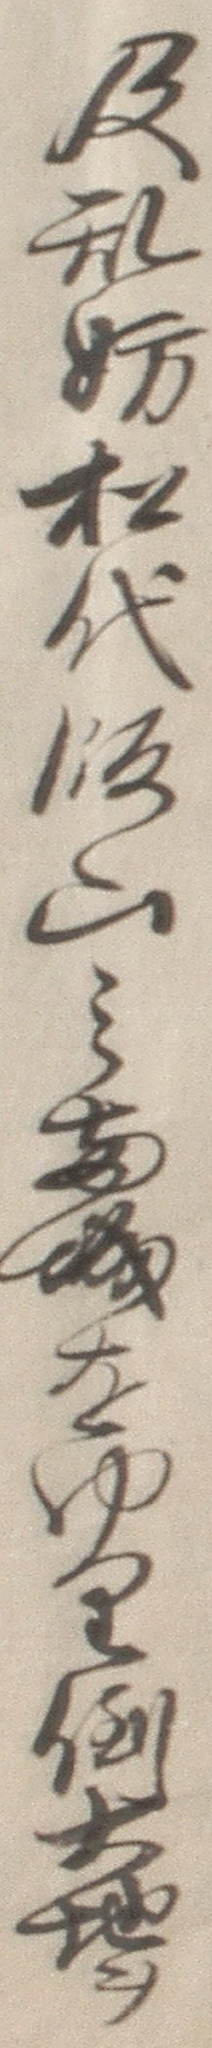及乱妨松代飯山之両城をゆり倒大地ヲ
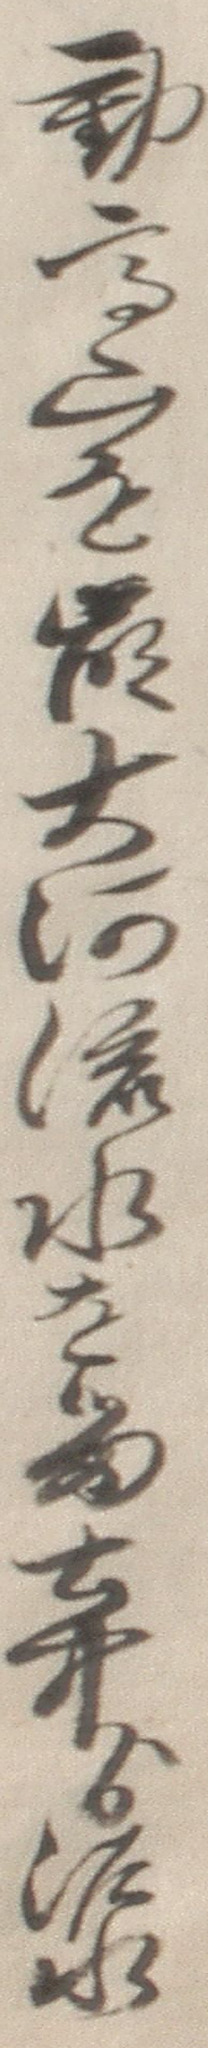動高山を崩大河流水を留地中ゟ泥水
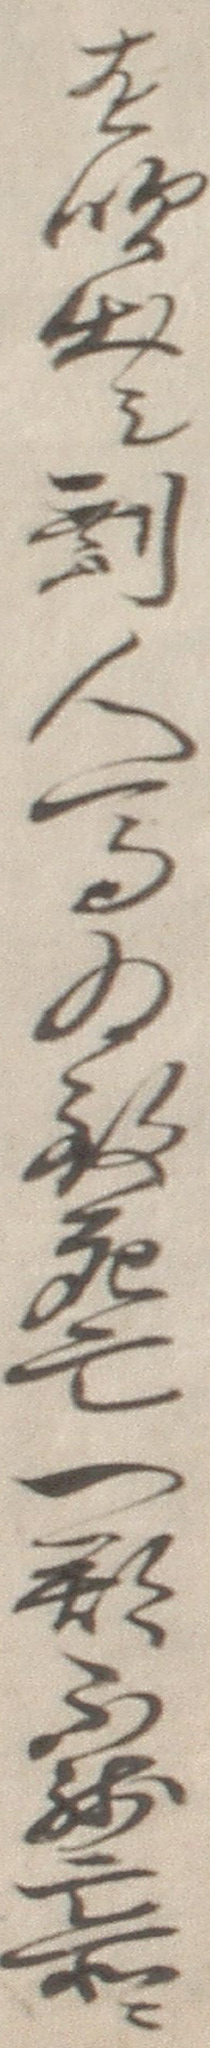を吹出ㇱ剰人馬為致死亡一郡不残亡所二
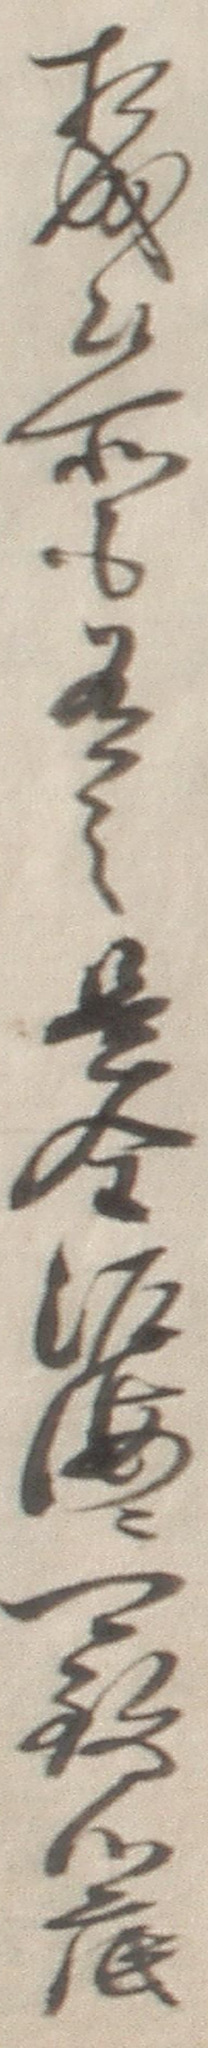相成候所も有之只今泥海二可致心底
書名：信州地震一件
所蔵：東京大学地震研究所図書室 Earthquake Research Institute Library, The University of Tokyo, JAPAN
